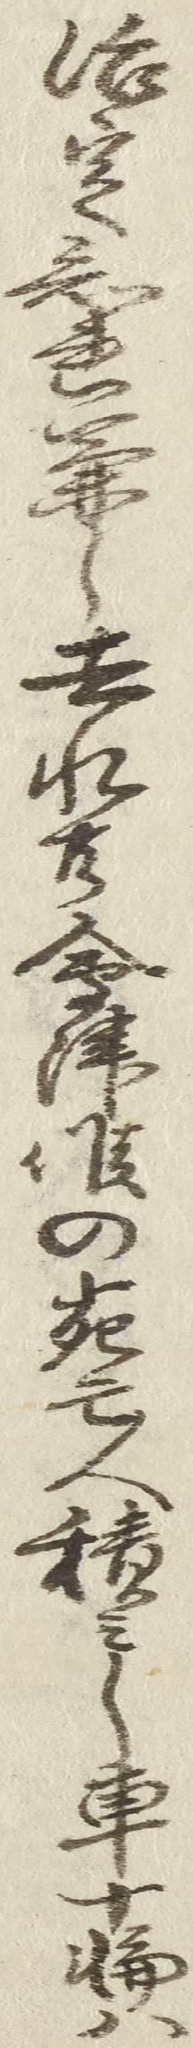治定知れ兼し去れ共会津侯の死亡人積みし車十輌は
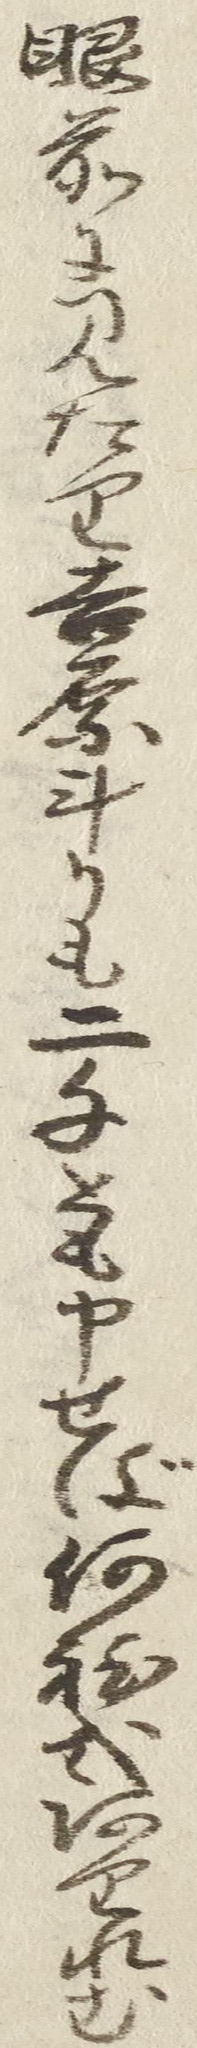眼前に見たり吉原斗りも二千とも申せば何程哉あはれむ
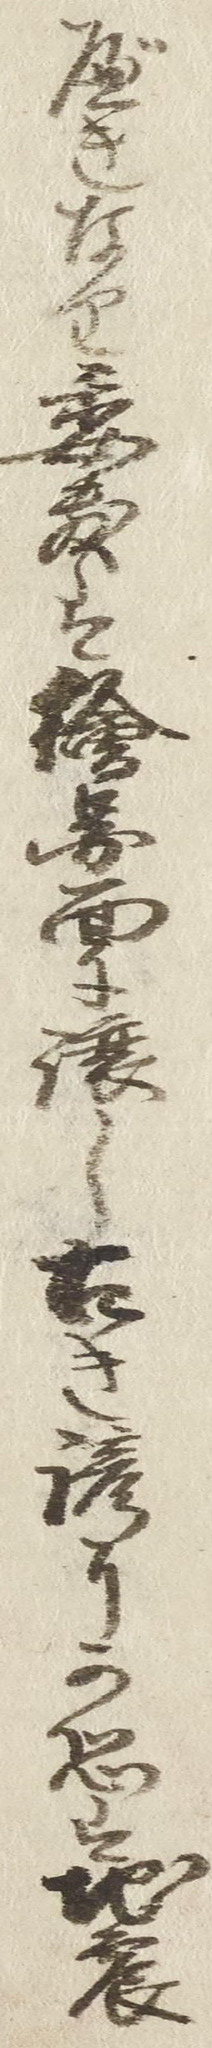へきなり委敷は絵圖面に譲し古き諺に可恐は地震
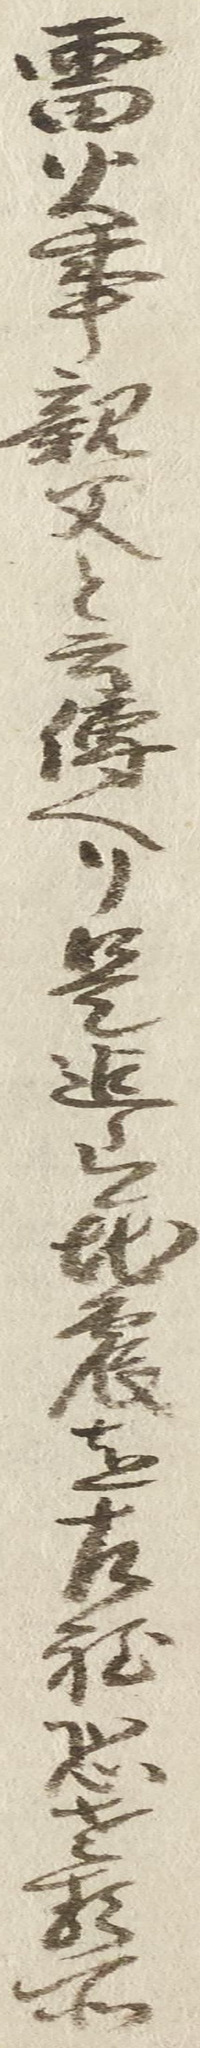雷火事親父と云伝へり是迄は地震を左程恐ける所
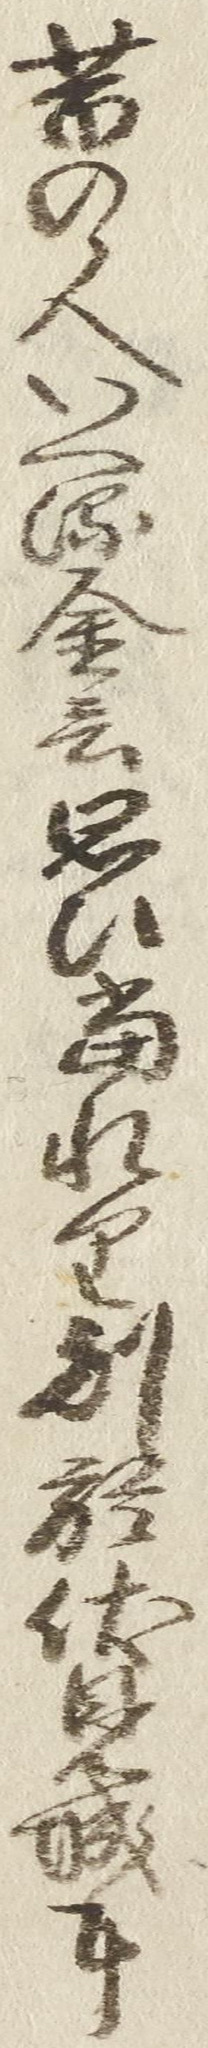昔の人いへる金言思ひ当れり則於伏見城に
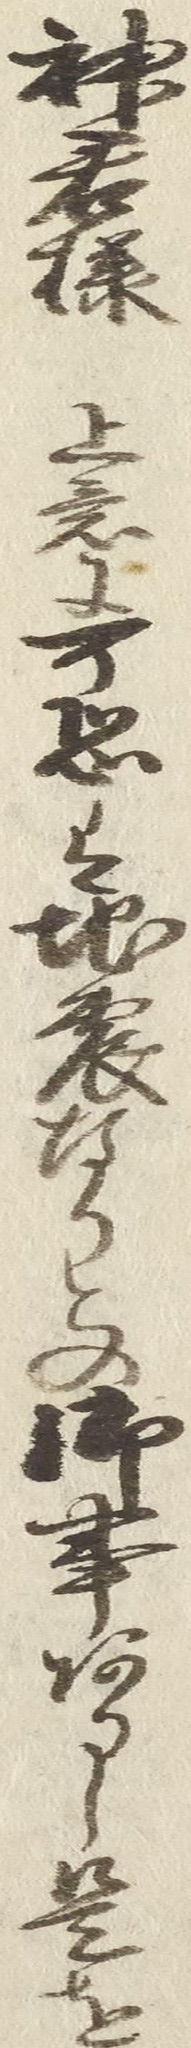神君様上意に可恐は地震なりとの御事ありし是を
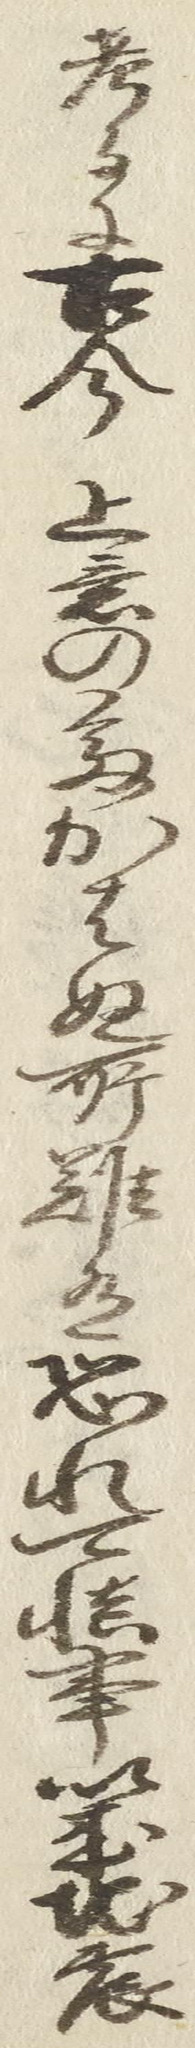考るに古今上意のうたかはぬ所難有畏れて慎事以来地震
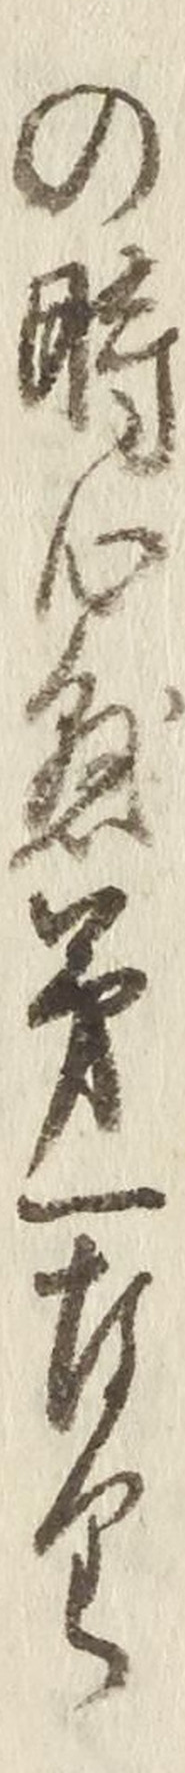の時心懸第一なり
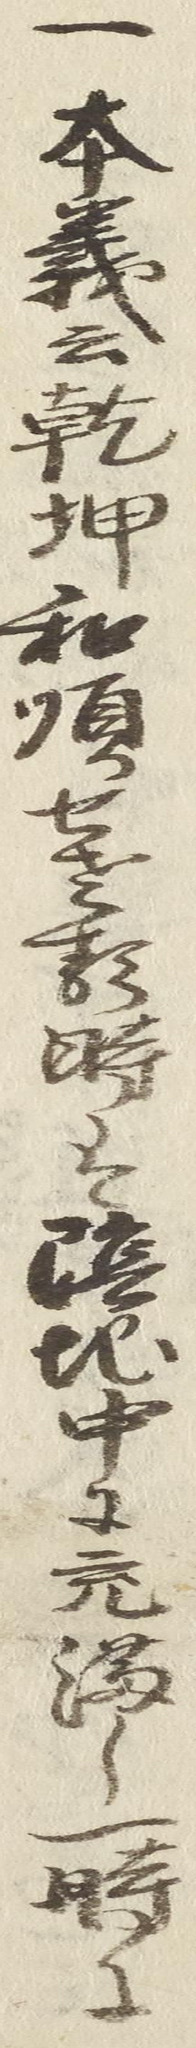一本義云乾坤和順せさる時は陰地中に充満し一時に
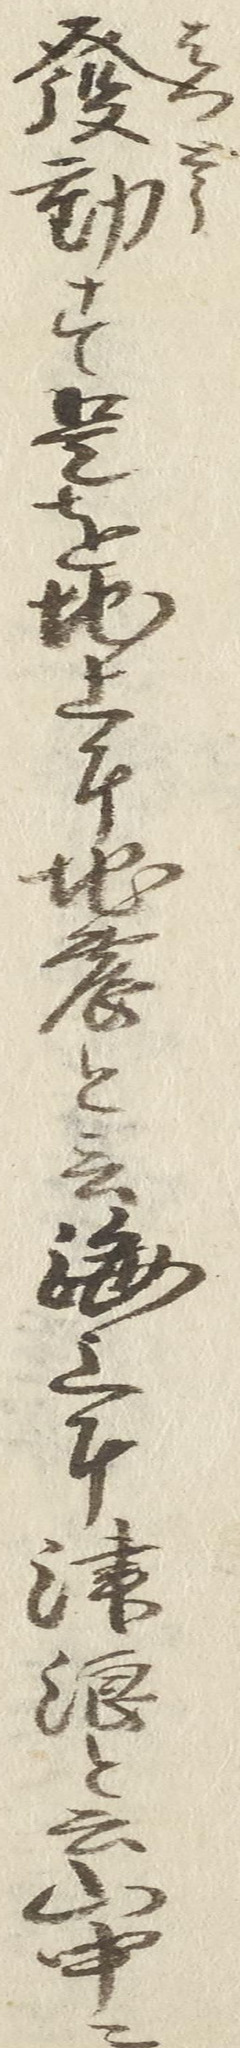発動す是を地上に地震と云海上に津浪と云山中に
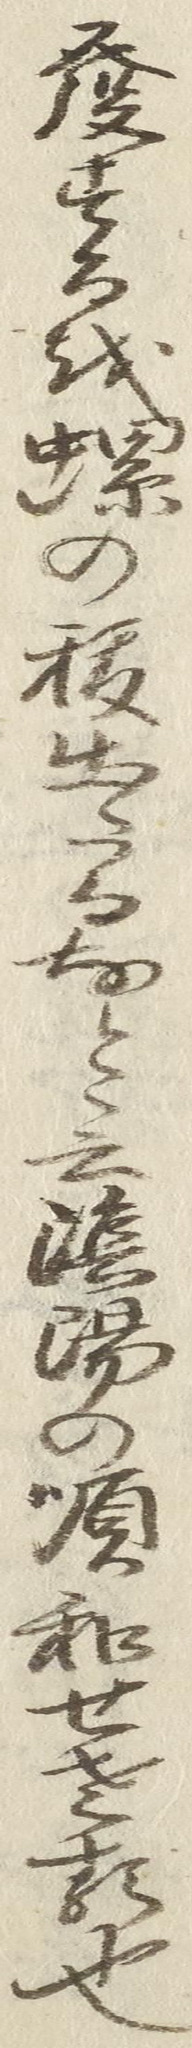溌するを螺の抜出たるなとゝ言陰陽の順和せさる也
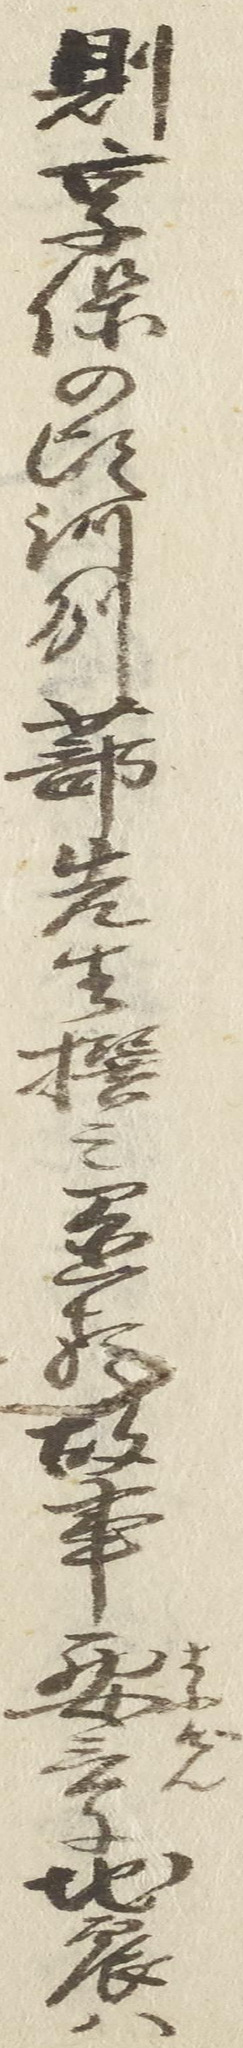則享保の頃阿州蔀先生選之置る故事要言に地震は
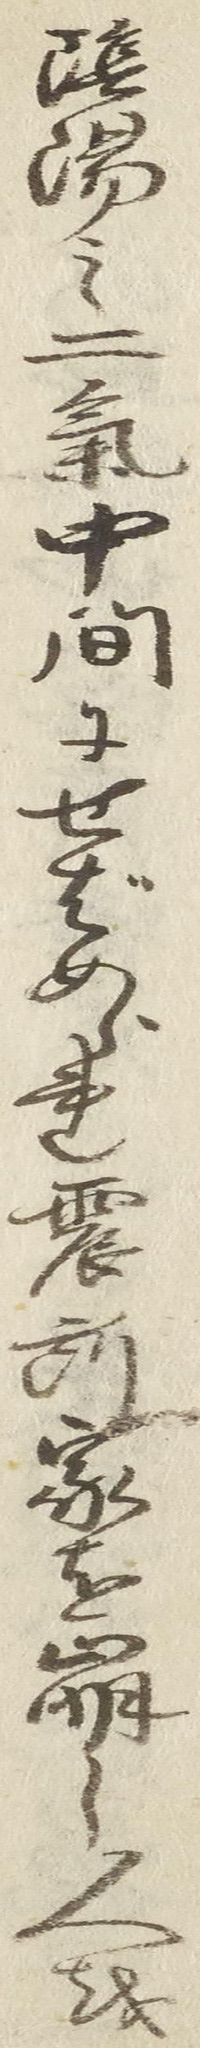陰陽之二気中間にせばめられ震所家を崩し人を
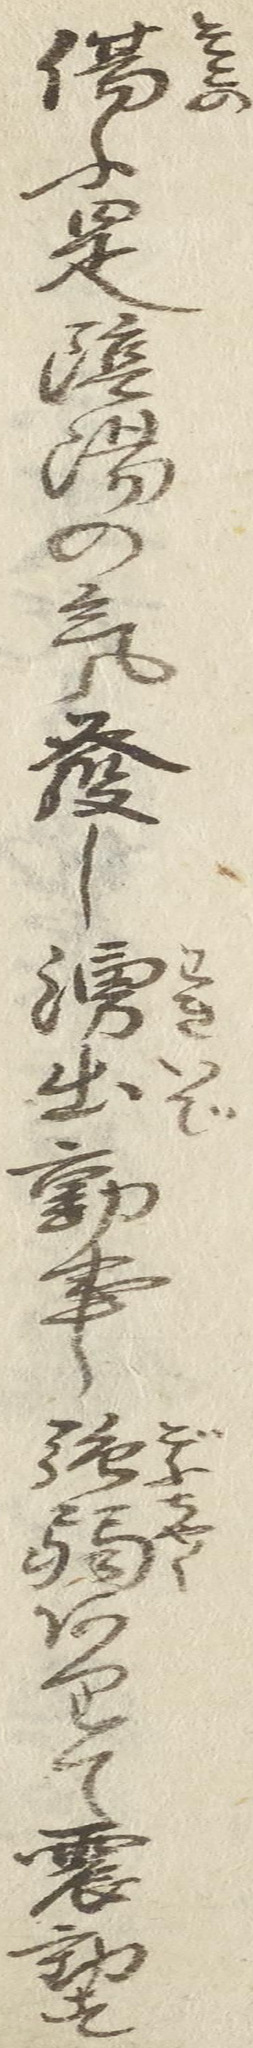傷ふ是陰陽の気発し湧出動事強弱ありて新道す
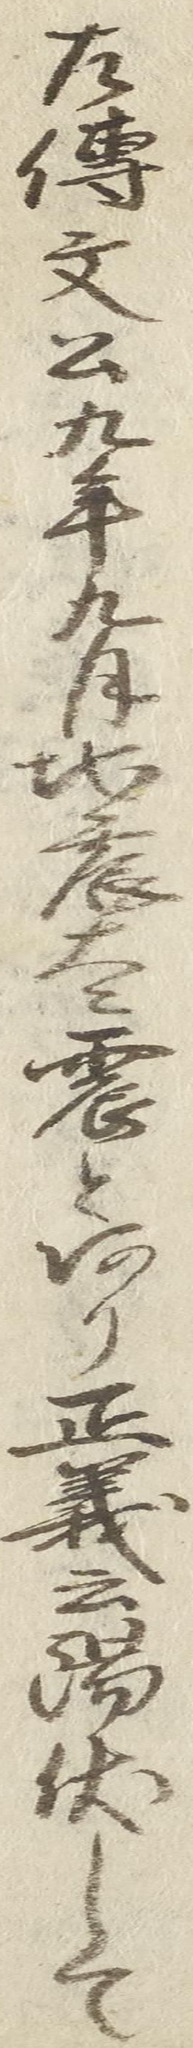左伝文公九年九月地震大に震とあり正義云陽伏して

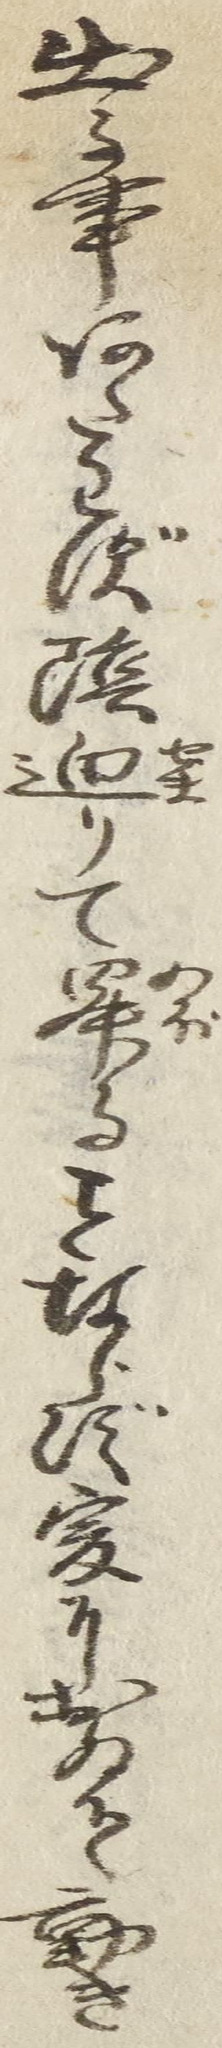出る事あたわず陰迫りて昇ることならず爰におゐて動き
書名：従往古地震御届書記誌之一
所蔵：東京大学地震研究所図書室 Earthquake Research Institute Library, The University of Tokyo, JAPAN
